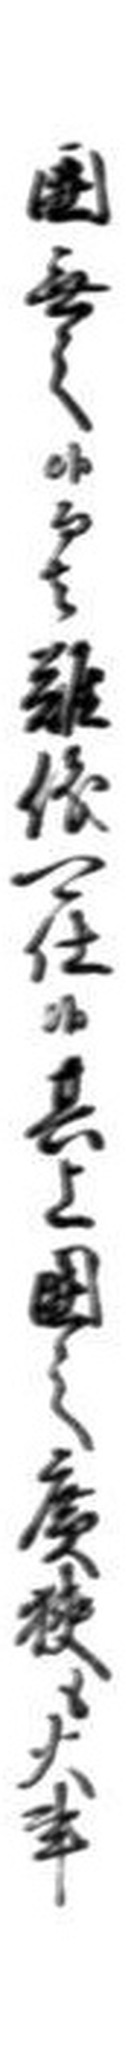囲無之候而者難儀可仕候其上囲之広狭も火事
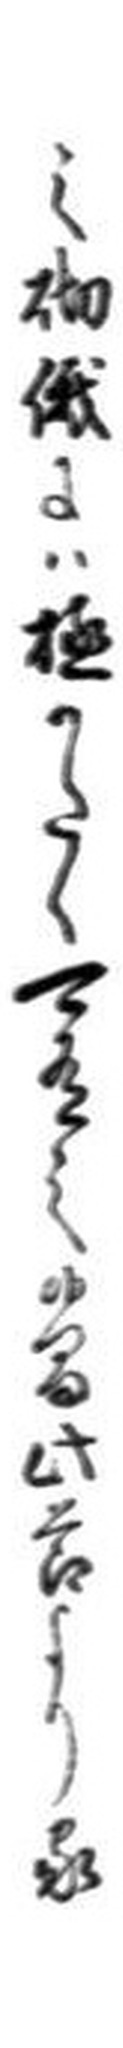之砌俄にハ極かたく可有之候間此節より家
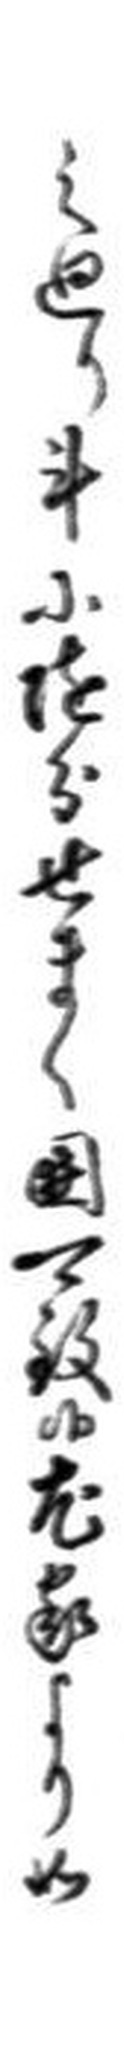之廻り斗に随分せまく囲可致候尤家より如
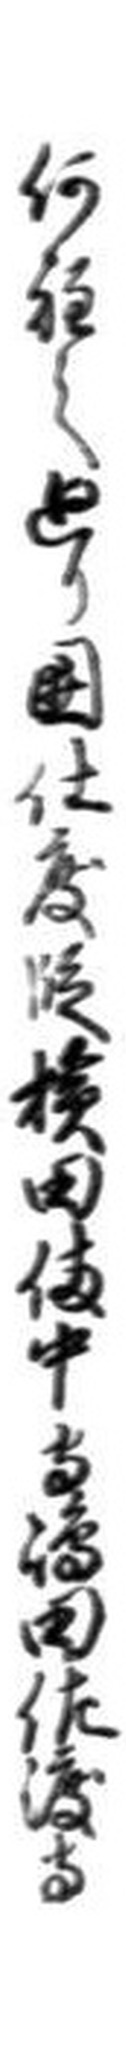何程之廻り囲仕度段横田備中守殿嶋田佐渡守
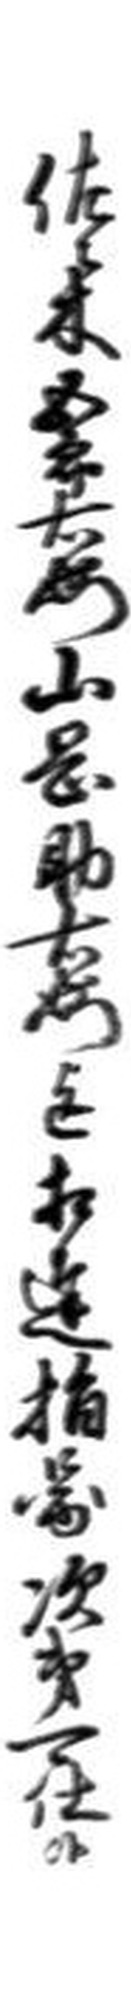佐々木五郎右衛門山岡助右衛門迄相達指図次第可仕候

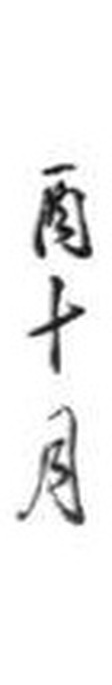酉十月
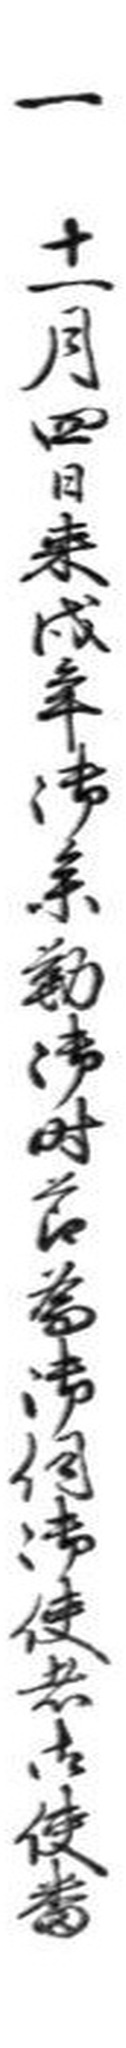一十一月四日来戌年御参勤御時節為御伺御使者御使番
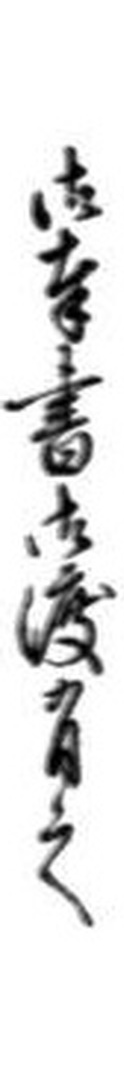御奉書御渡有之
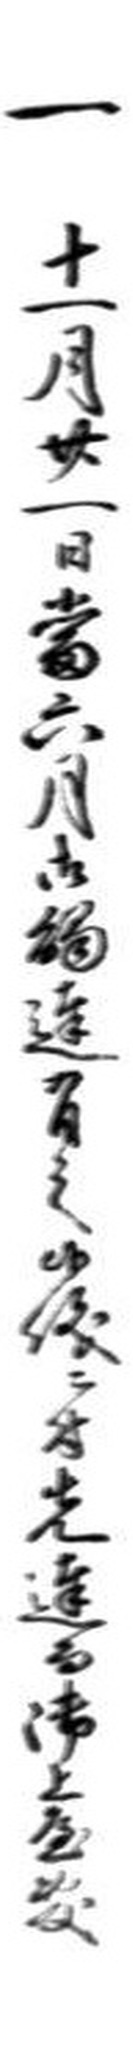一十一月廿一日当六月御触達有之候儀ニ付先達而御上屋敷
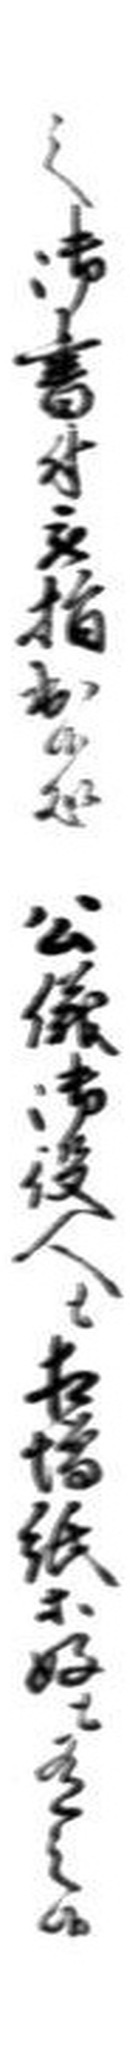之御書付被指出候処公儀御役人も相増紙等好と有之候
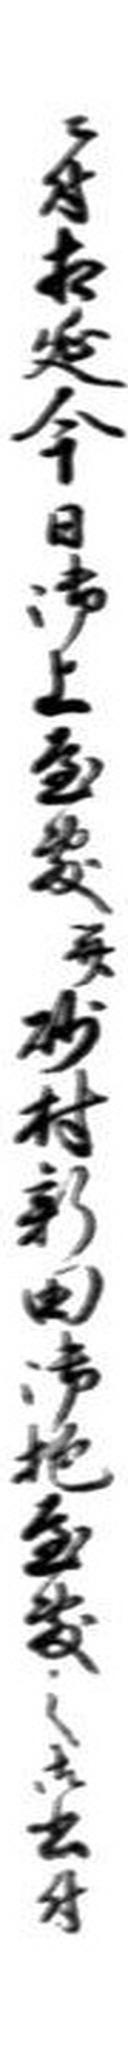ニ付相延今日御上屋敷并砂村新田御抱屋敷之御書付
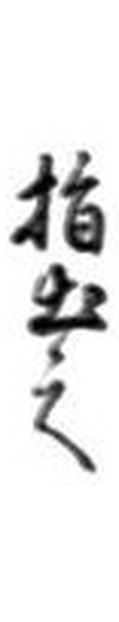指出之

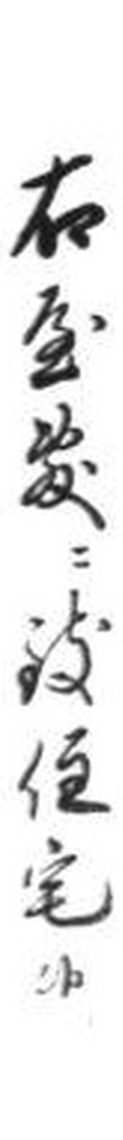右屋敷ニ致住宅候
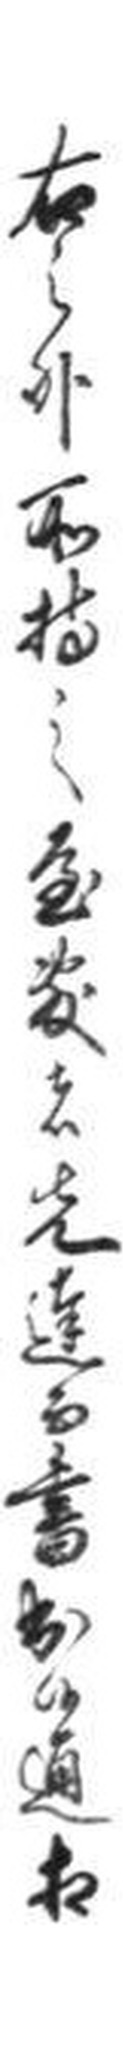右之外所持之屋敷者先達而書出候通相
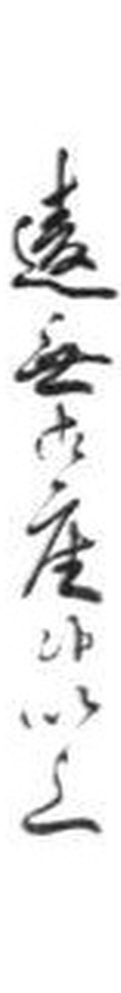違無御座候以上
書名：家譜 三十二 吉邦公 従享保二年到享保三年
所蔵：福井県文書館 Fukui Prefectural Archives
